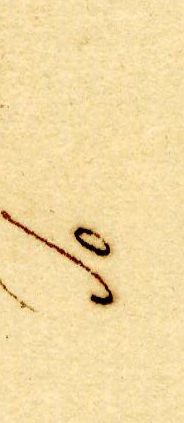To
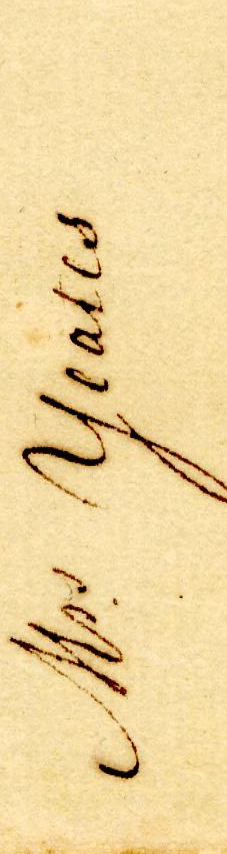M^rs. Yeates
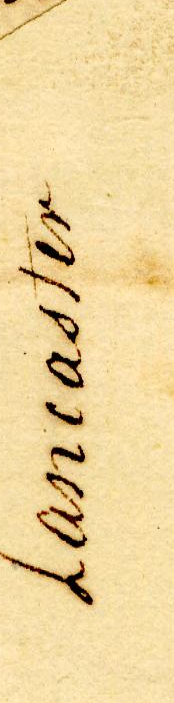Lancaster
